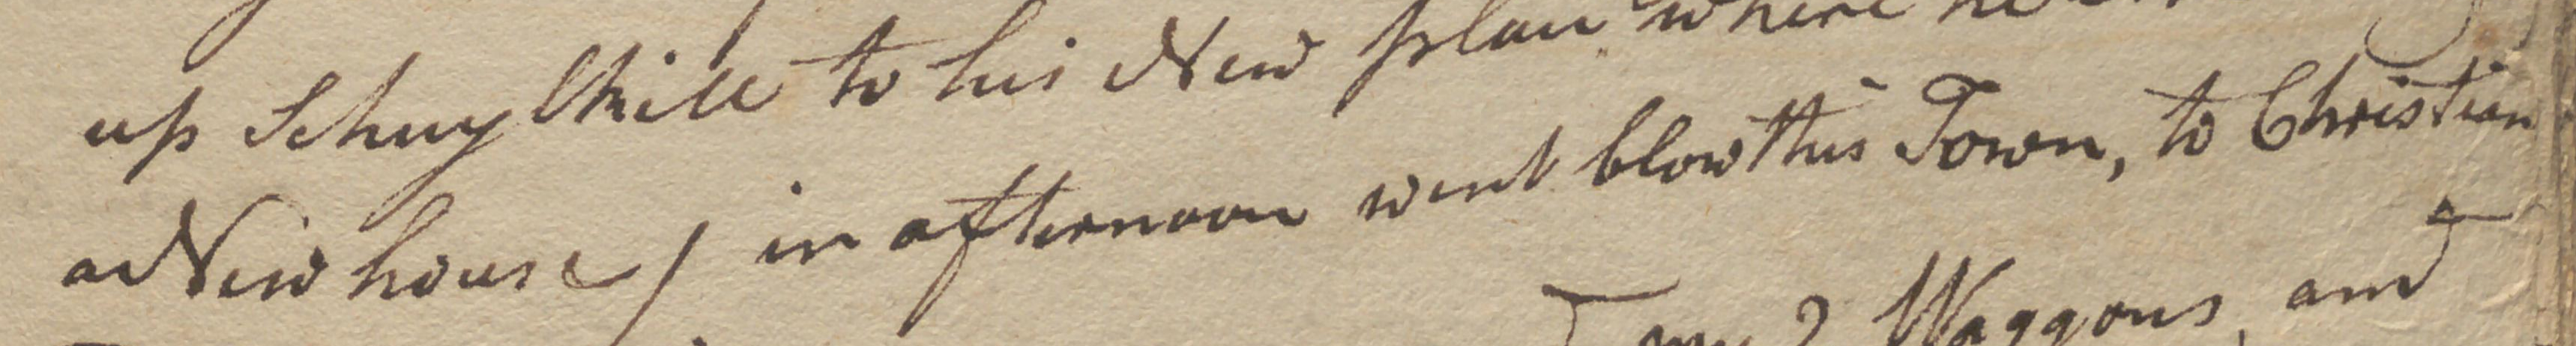a New house, in afternoon went blow this Town, to Christian
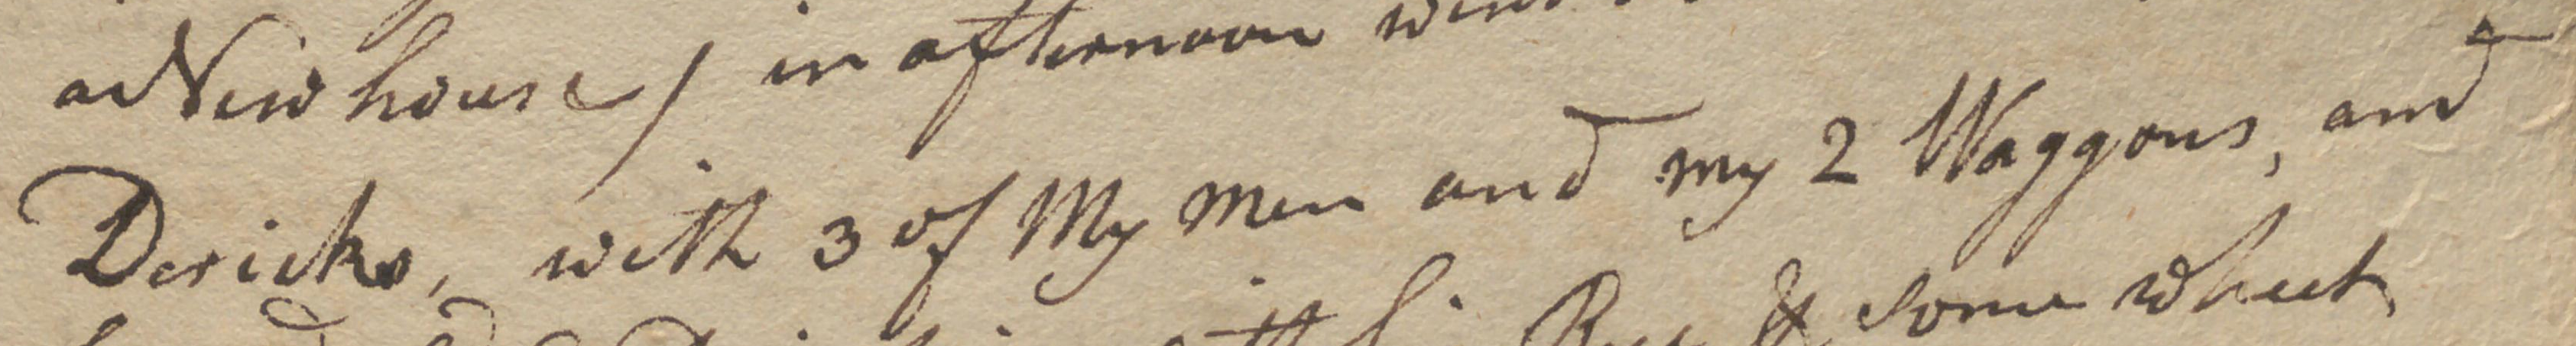Dericks, with 3 of My Men and my 2 Waggons, and
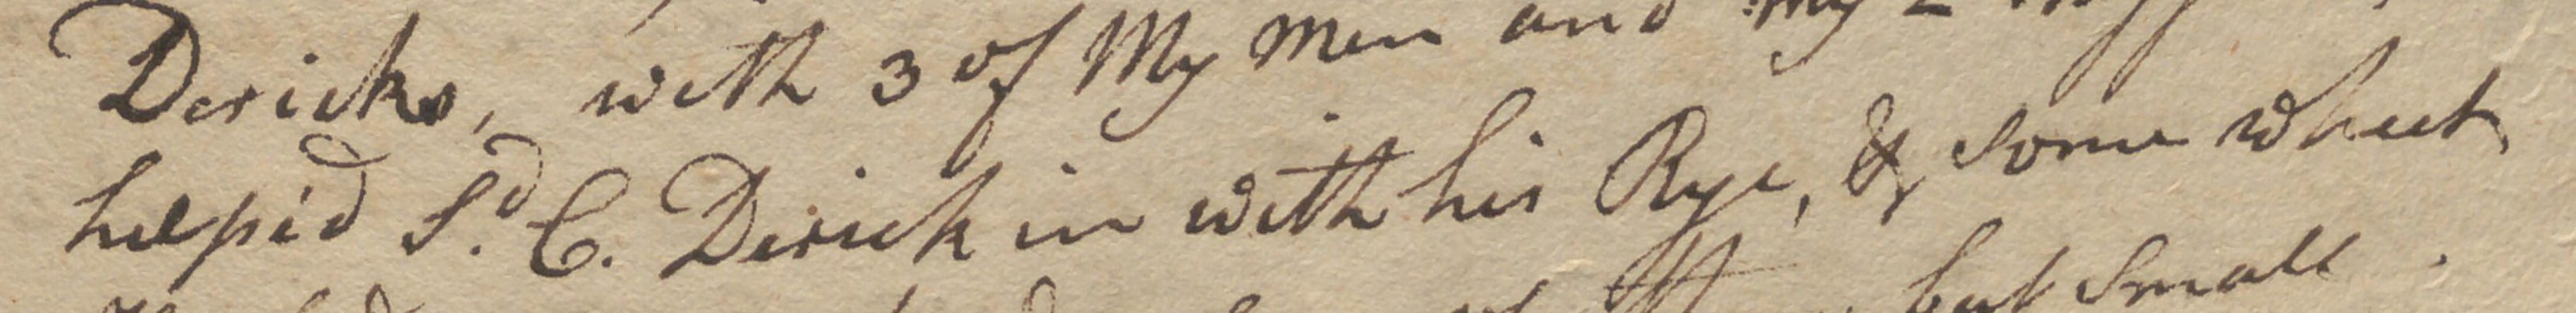helped s^d. C. Derick in with his Rye, & some wheet
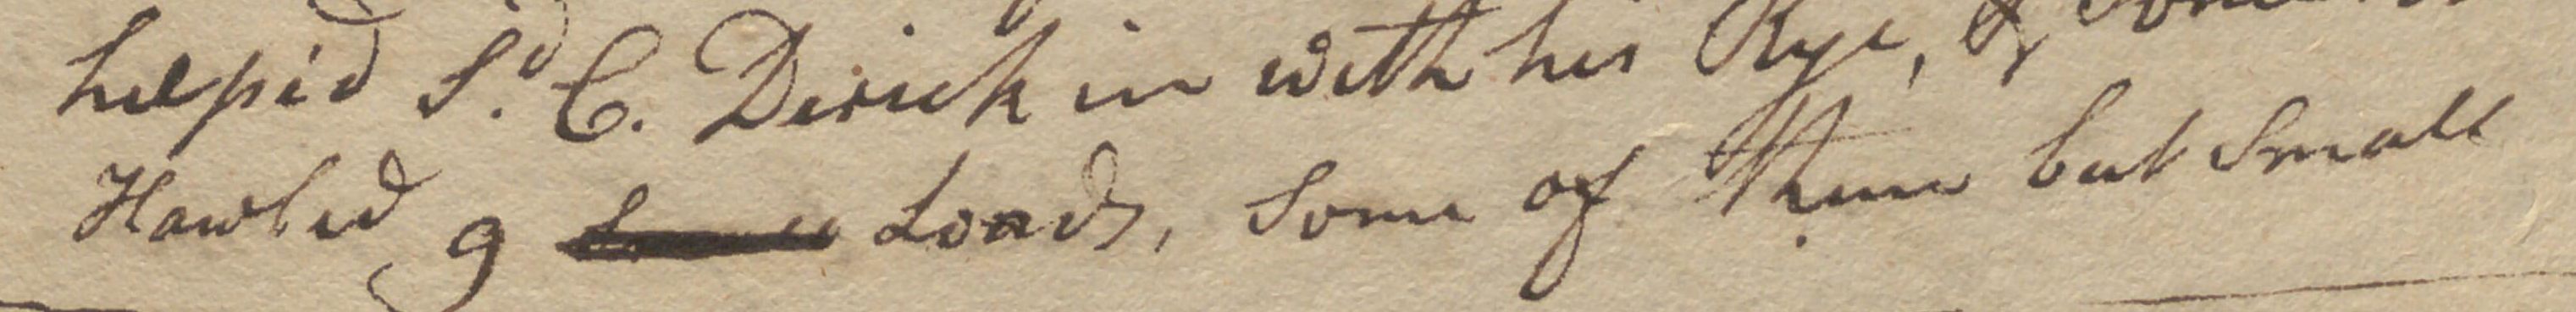Hawled 9 [small] Loads, some of them but small
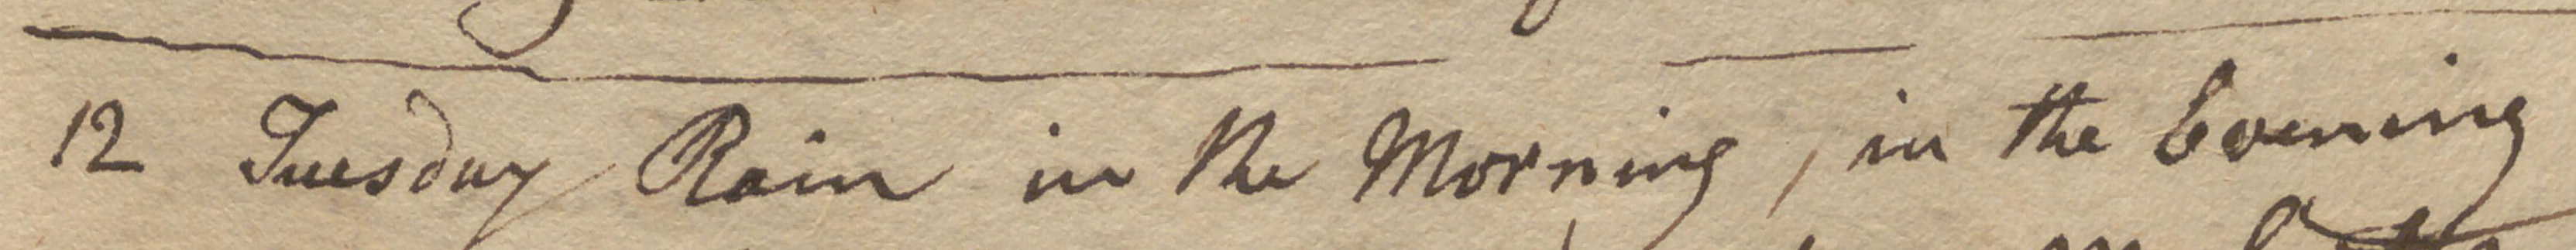12 Tuesday Rain in the Morning, in the Evening
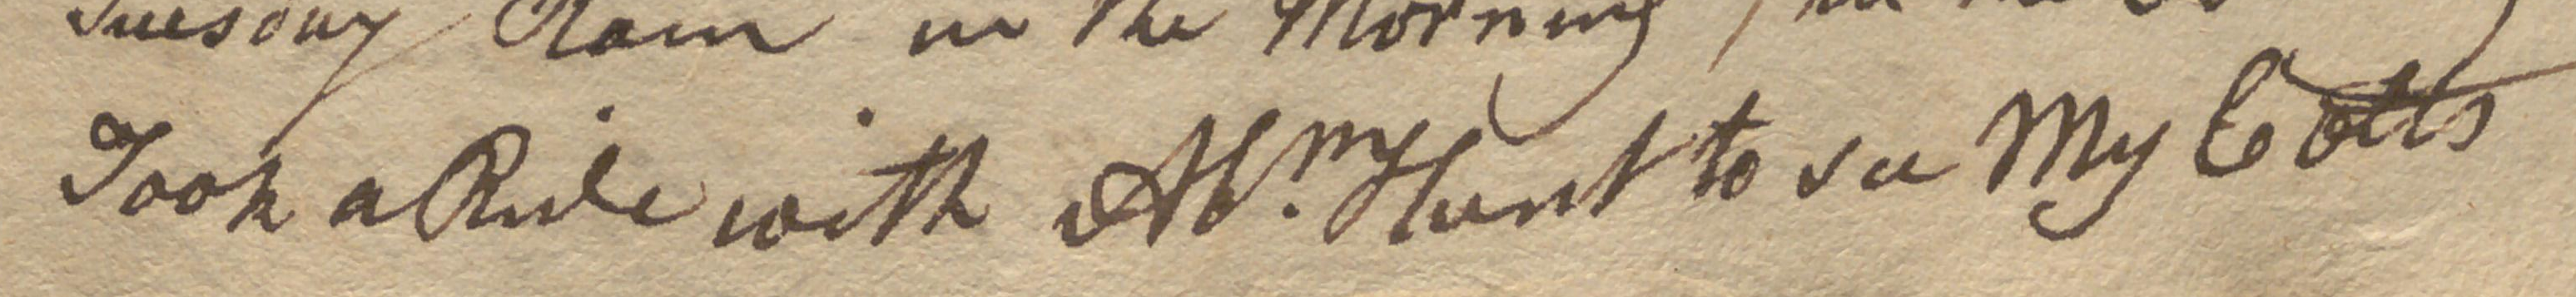Took a Ride with M^r. Hunt to see My Colts
